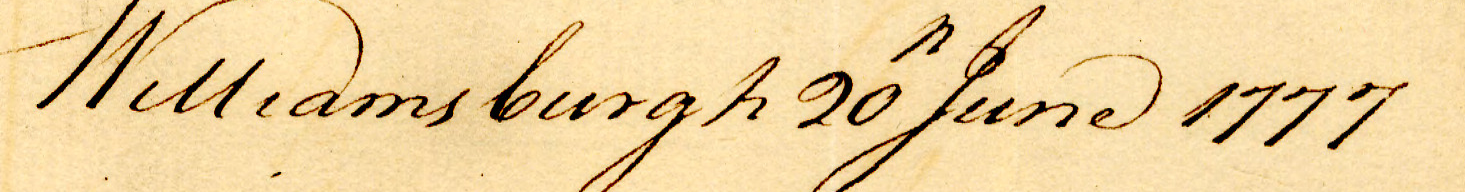Williamsburgh 20^th June 1777
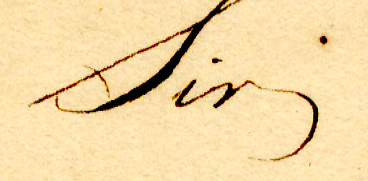Sir,
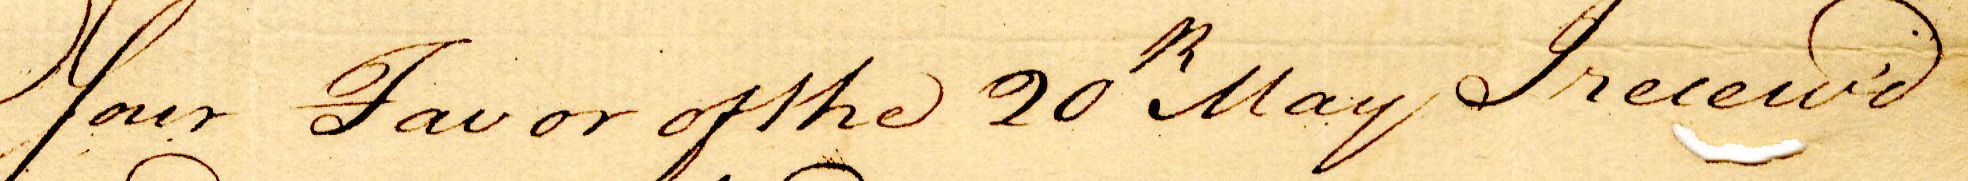Your Favor of the 20^th May I receiv'd
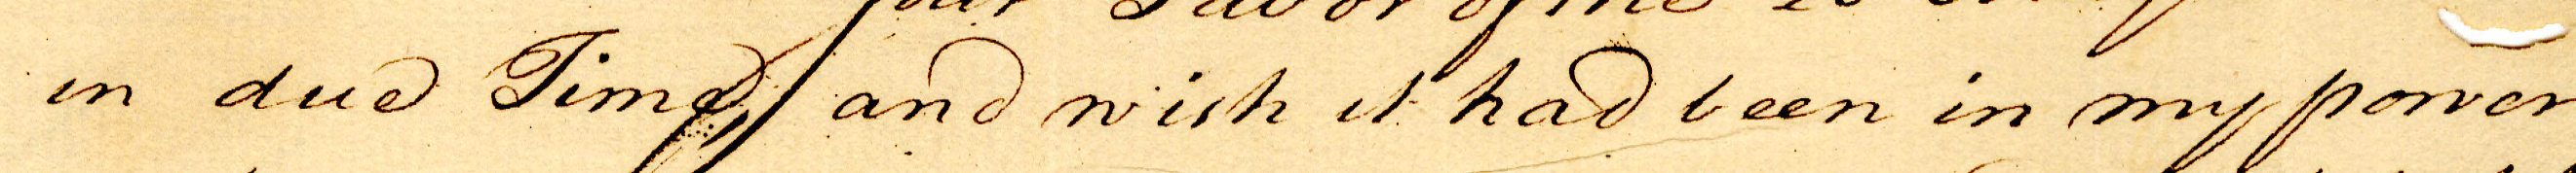in due Time and wish it had been in my power
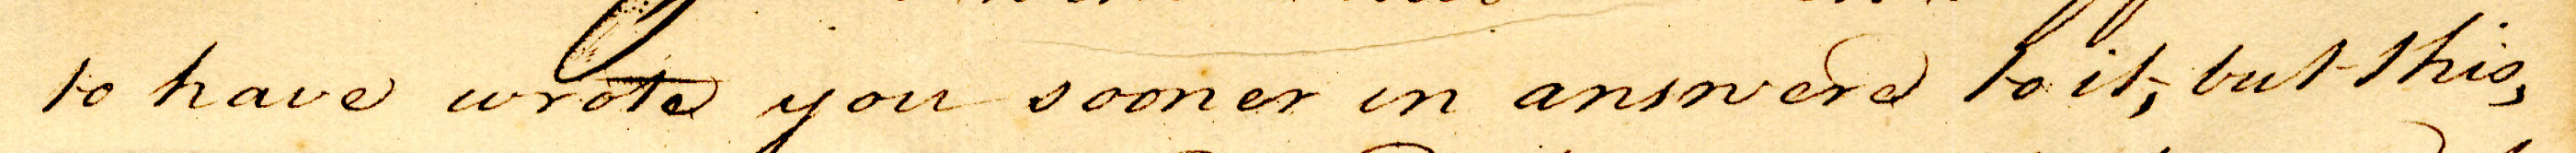to have wrote you sooner in answerd to it, but this,
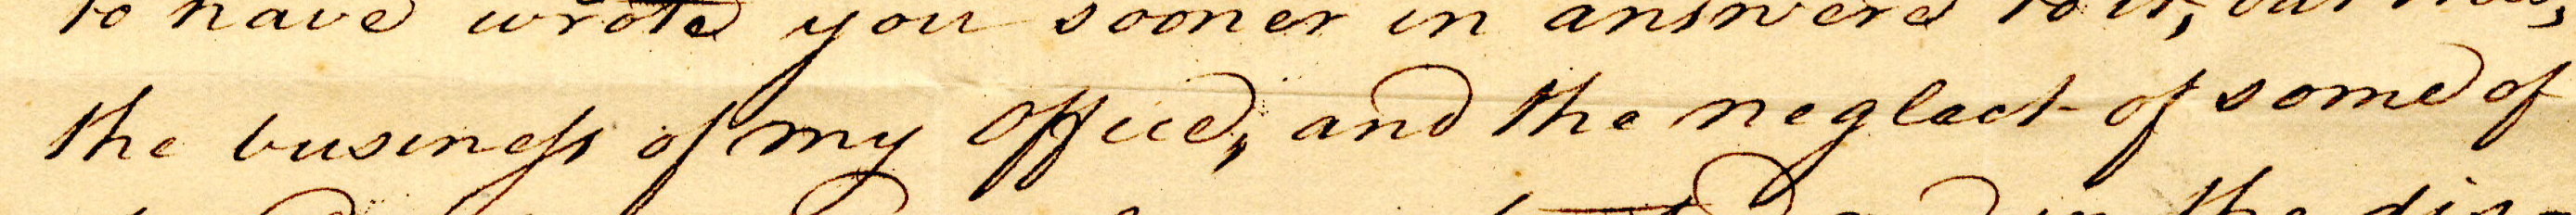the business of my Office and the neglect of some of
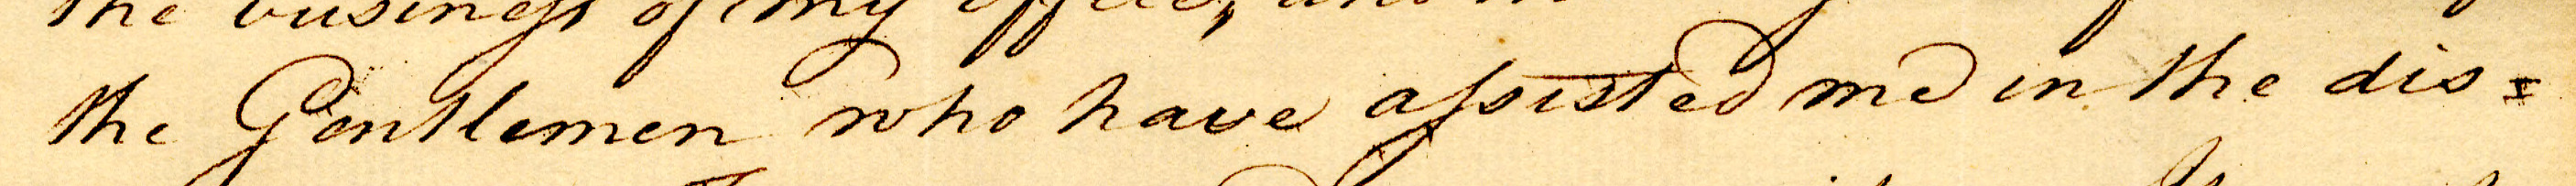the Gentlemen who have assisted me in the dis-
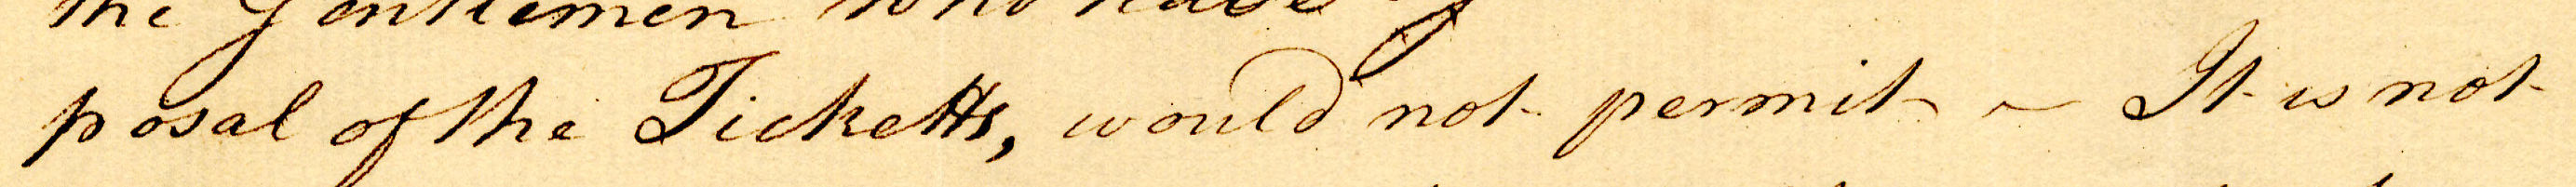posal of the Ticketts, would not permit- It is not
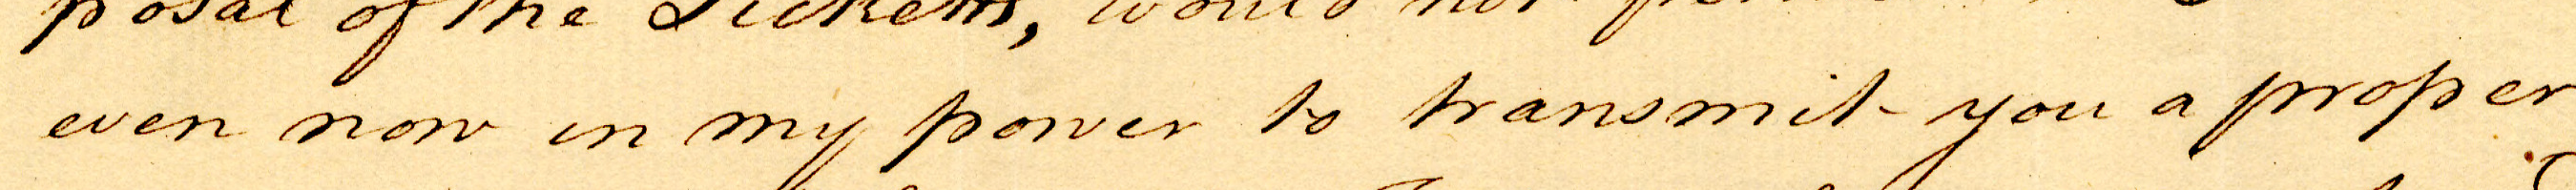even now in my power to transmit you a proper
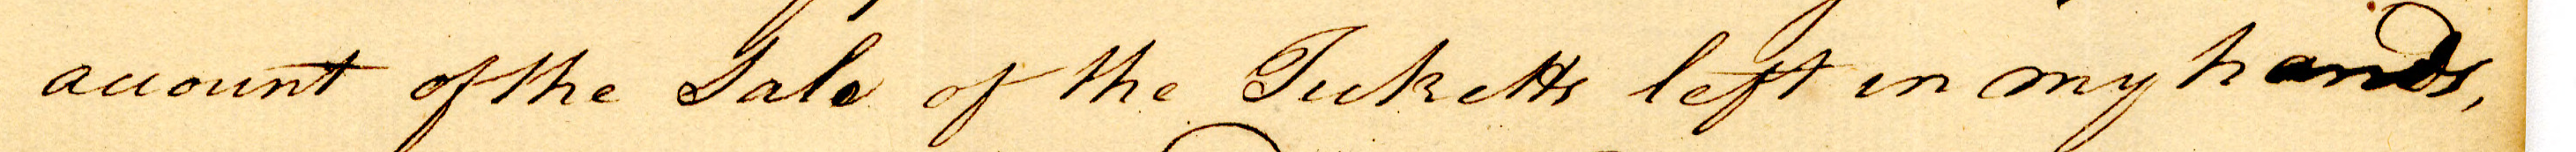account of the Sale of the Tickets left in my hands
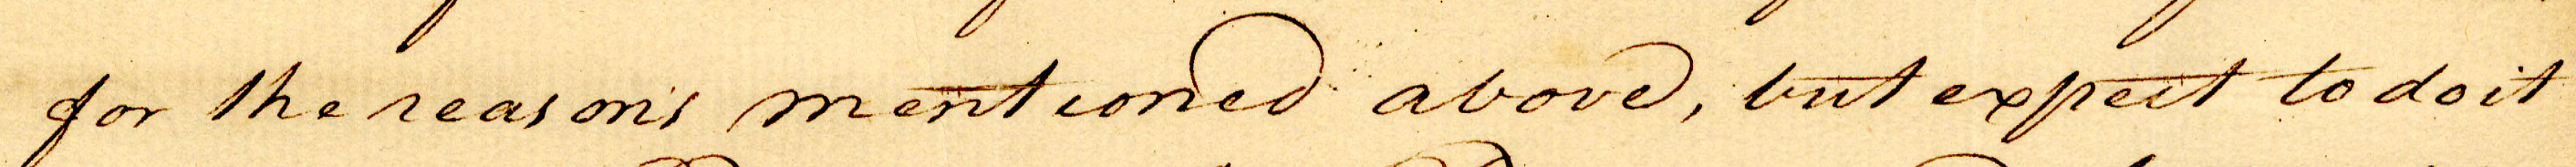for the reasons mentioned above, but expect to do it
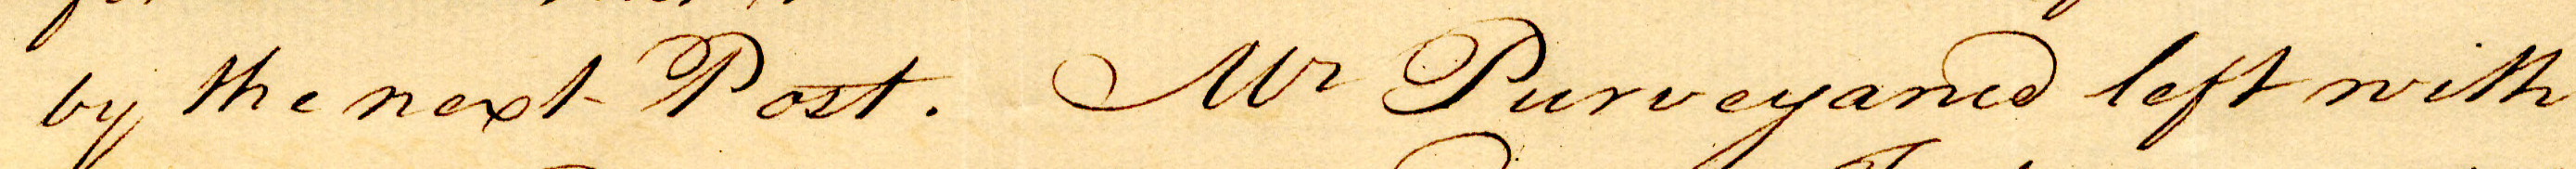by the next Post. Mr Purveyaned left with
